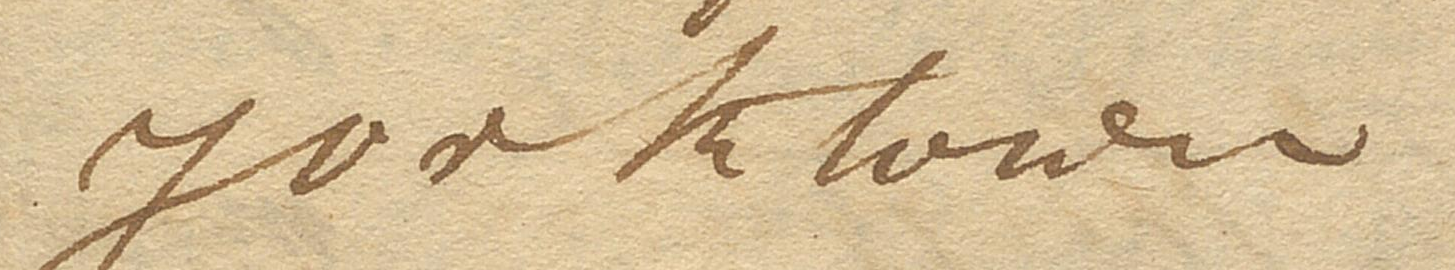yorktown
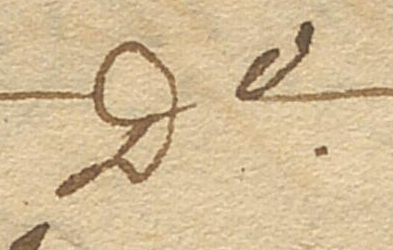D^o.
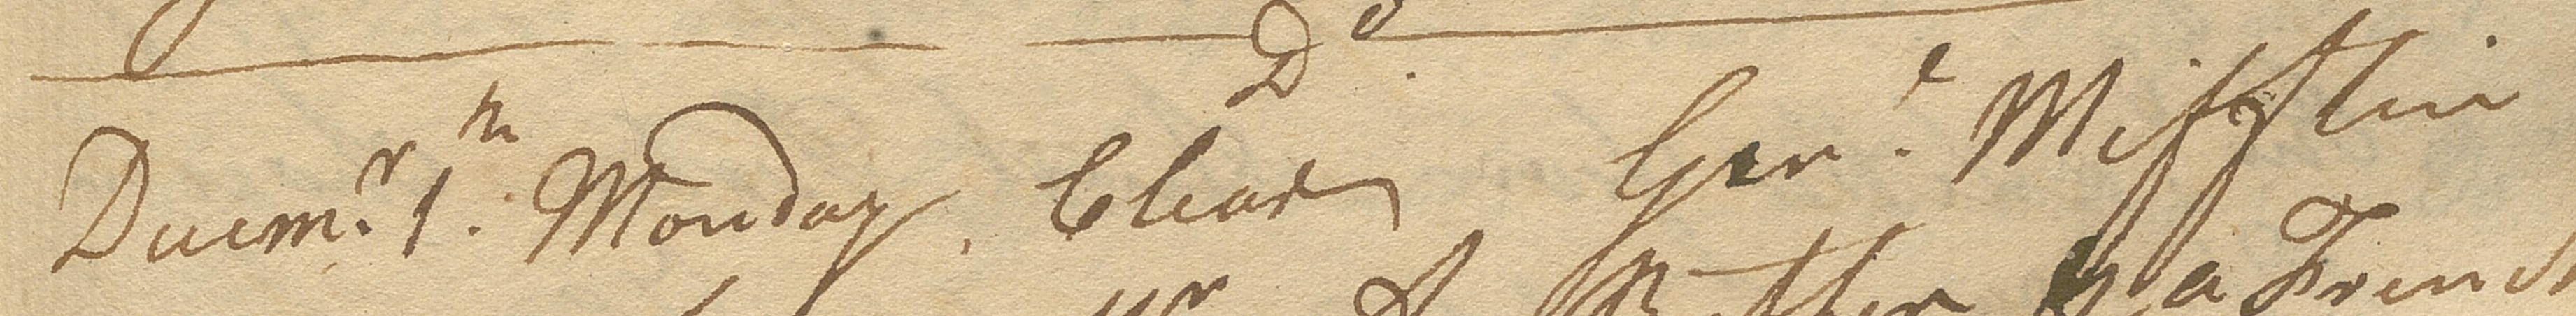Decem^r. 1^th. Monday Clear Ger^l. Mifflin
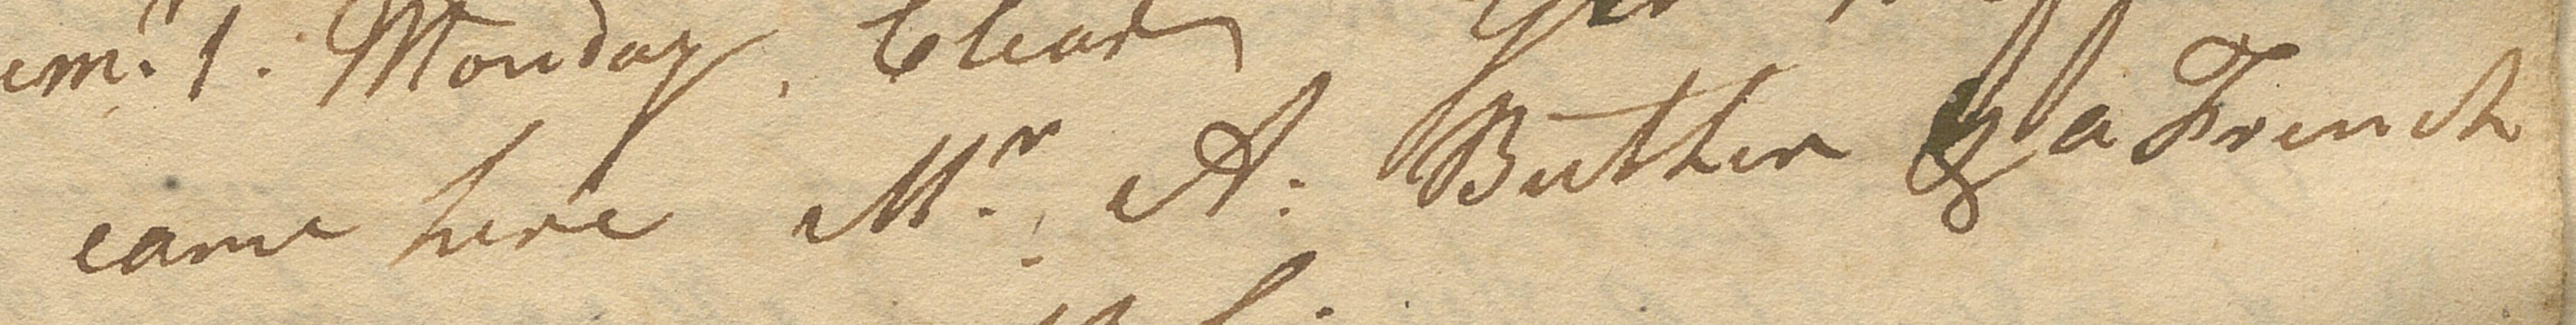came here M^r. A. Butler & a French
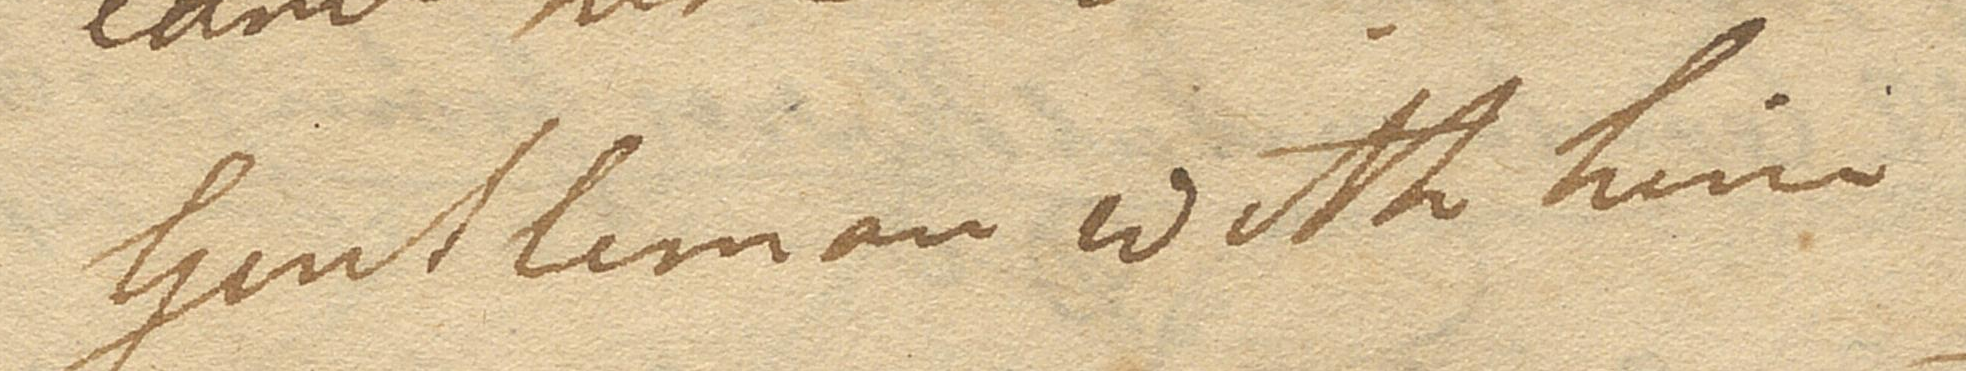Gentleman with him
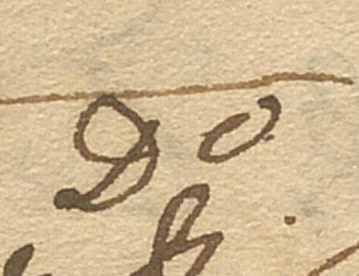D^o.
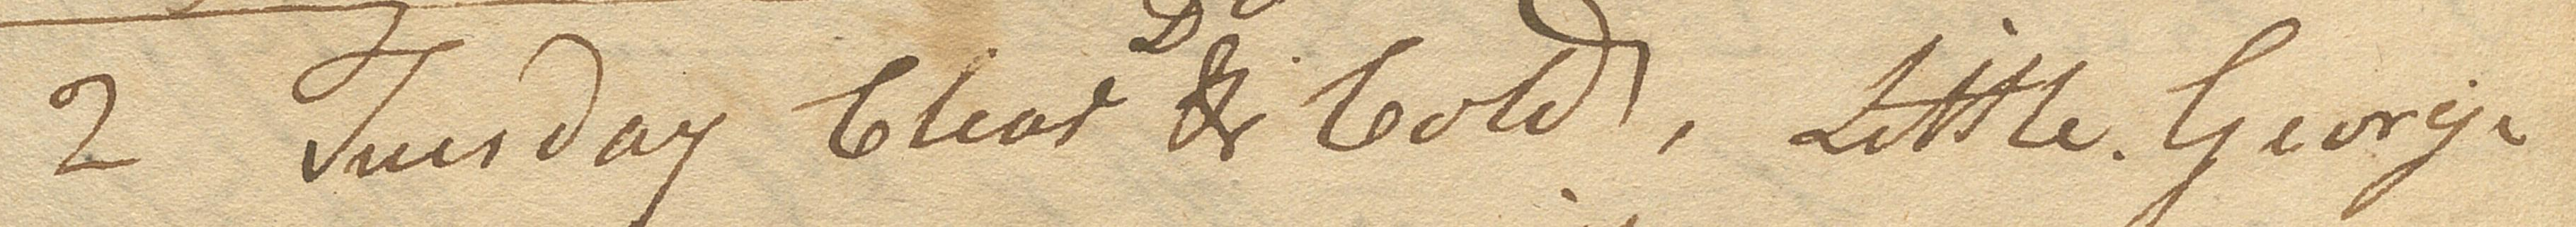2 Tuesday Clear & Cold, Little George
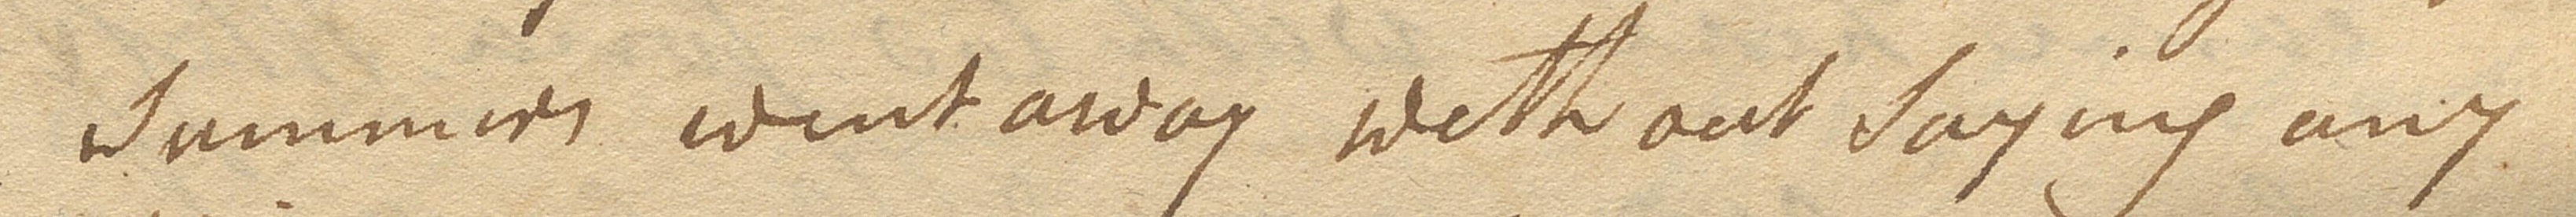Summers went away with out saying any
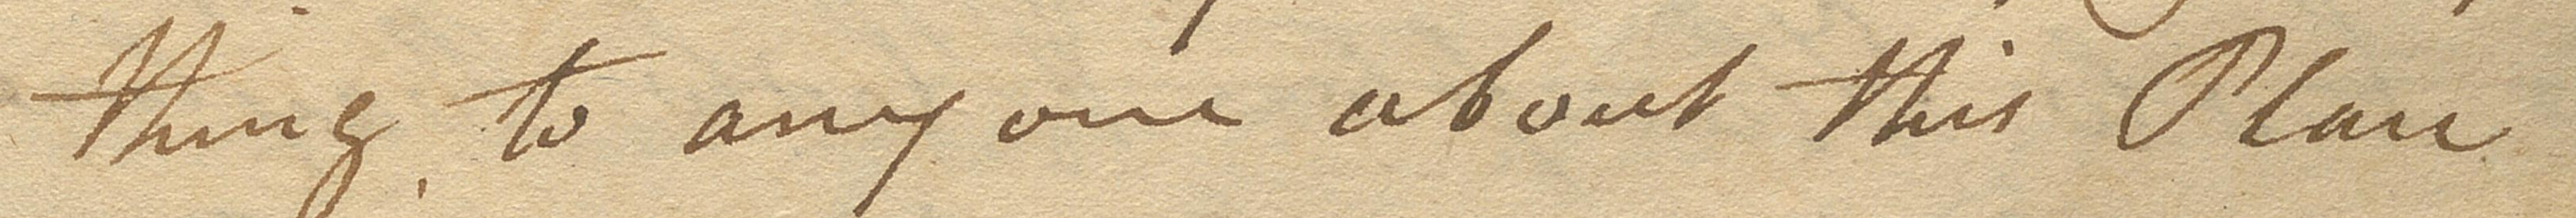thing to any one about this Place
